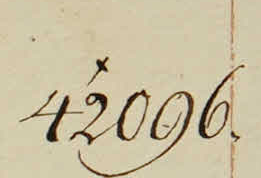42096
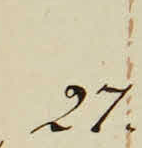27
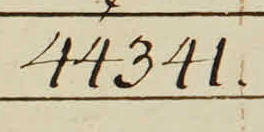44341
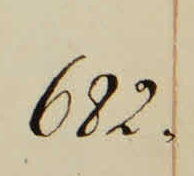682
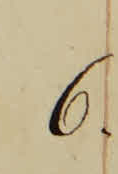6
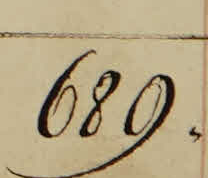689
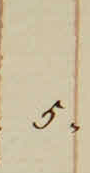5
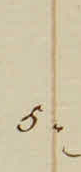5
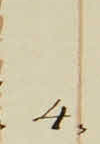4
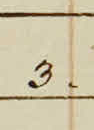3
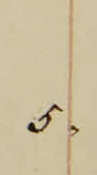5
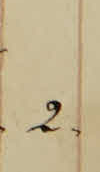2
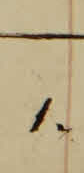1
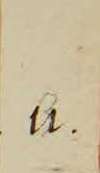11
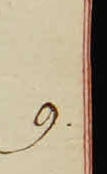9.
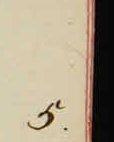5.
